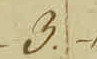3.
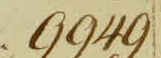9949
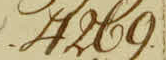4269.
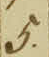5.
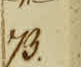73.
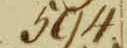594.
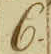6.
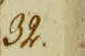32.
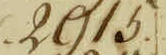2915.
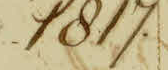1817.
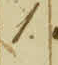1.
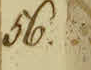56.
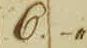6.
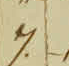7.
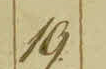19.
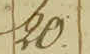20.
